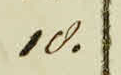18.
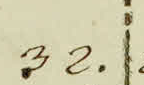32.
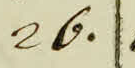26.
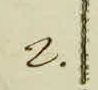2.
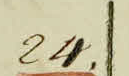24.
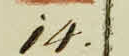14.
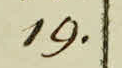19.
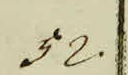52.
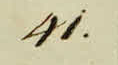41.
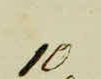10
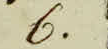6.
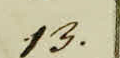13.
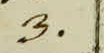3.
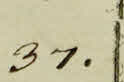37.
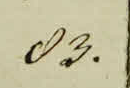83.
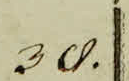38.
